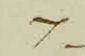7
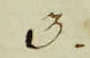3
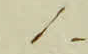1
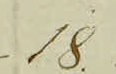18
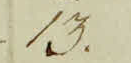13
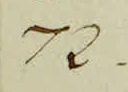72
